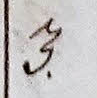3.
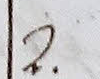2.
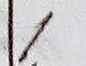1.
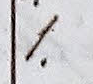1.
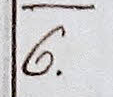6.
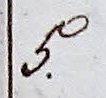5.
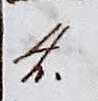4.
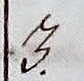3.
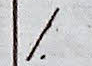1.
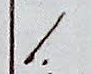1.
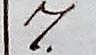7.
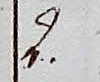2.
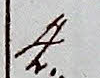4.
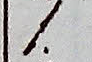1.
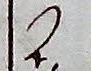2
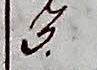3.
